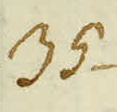35
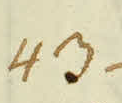43
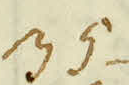35
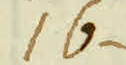16
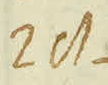28
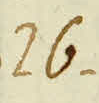26
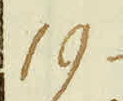19
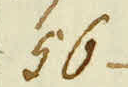56
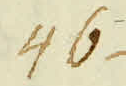46
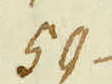59
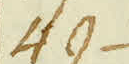49
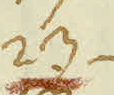23
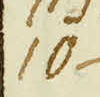10
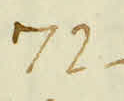72
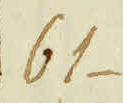61
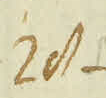28
